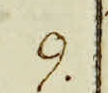9.
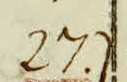27.
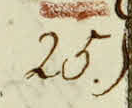25.
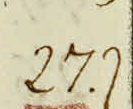27.
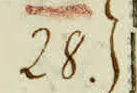28.
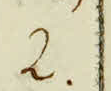2.
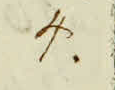4.
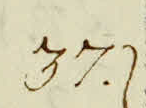37.
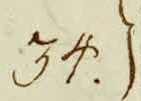34.
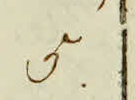5.
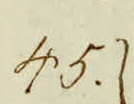45.
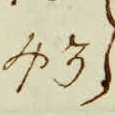43
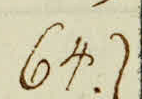64.
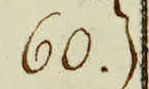60.
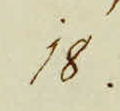18
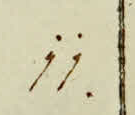11.
